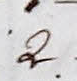2
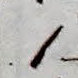1
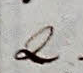2
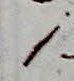1
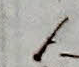1
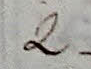2
